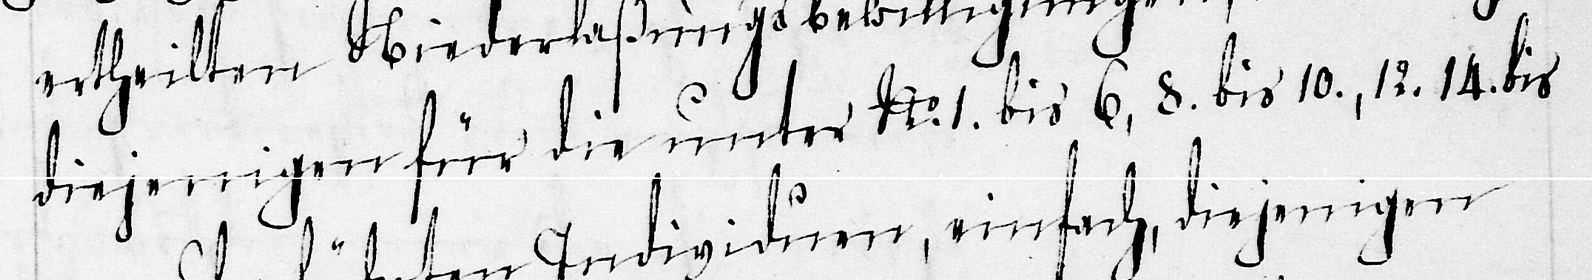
diejenigen für die unter No. 1 bis 6, 8. bis 10., 12. 14. bis
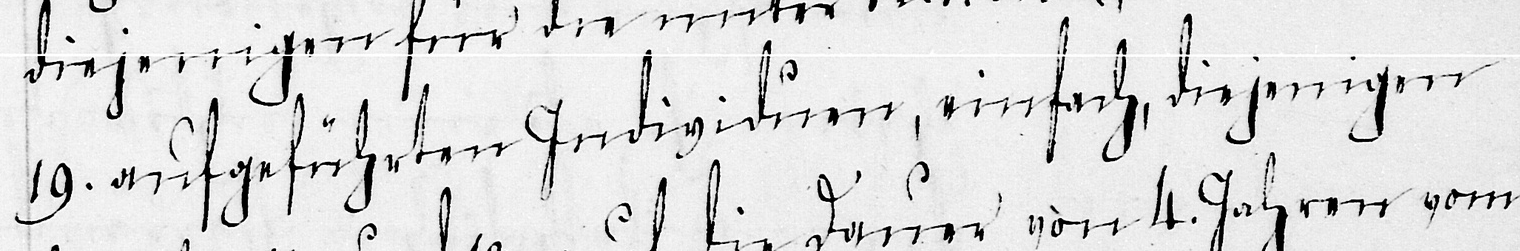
19. aufgeführten Individuen, einfach, diejenigen
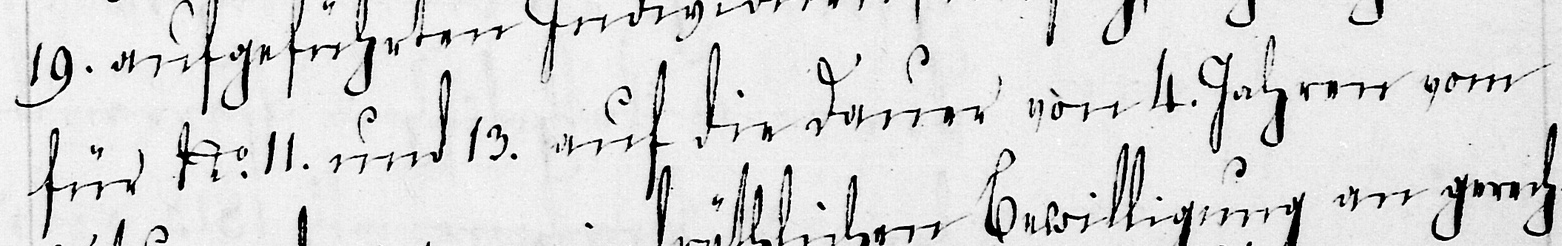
für No. 11. und 13. auf die Dauer von 4. Jahren vom
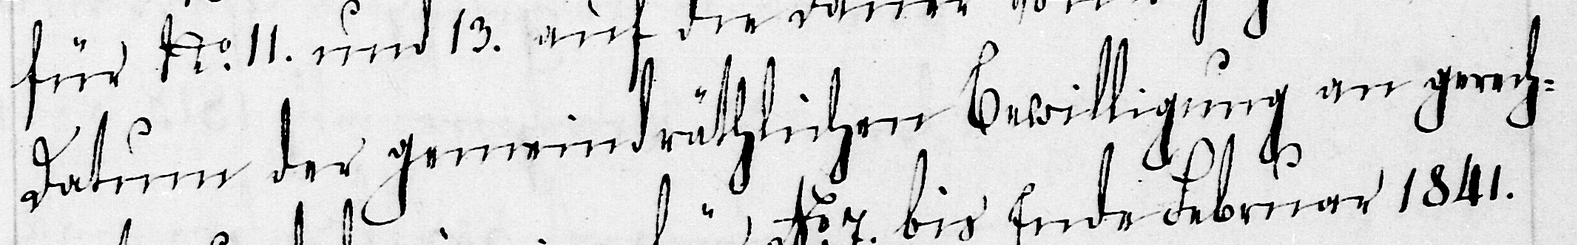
Datum der gemeindräthlichen Bewilligung an gerech¬
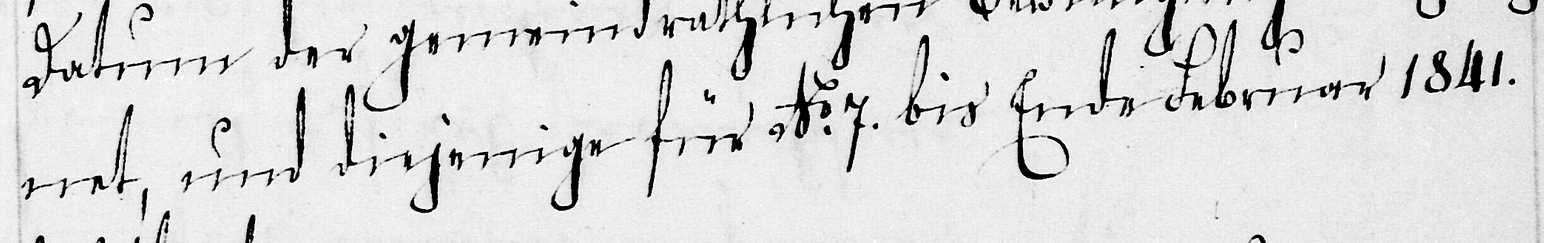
net, und diejenige für No. 7. bis Ende Februar 1841.
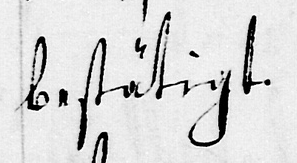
bestätigt.
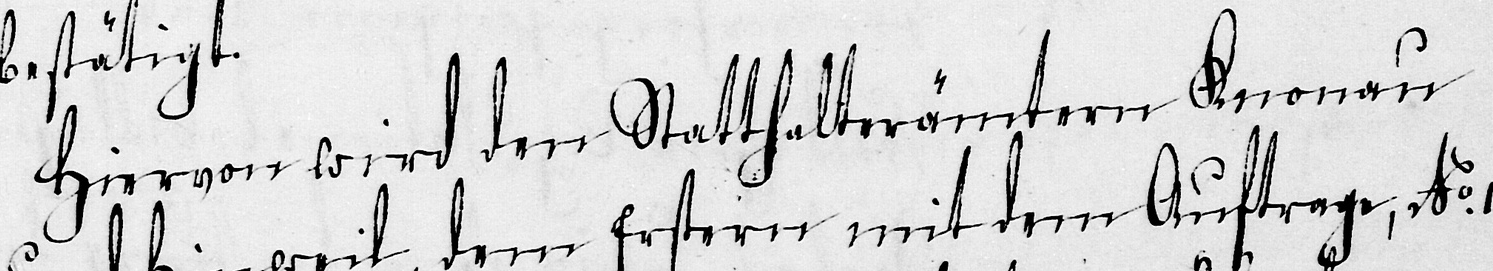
Hiervon wird den Statthalterämtern Knonau
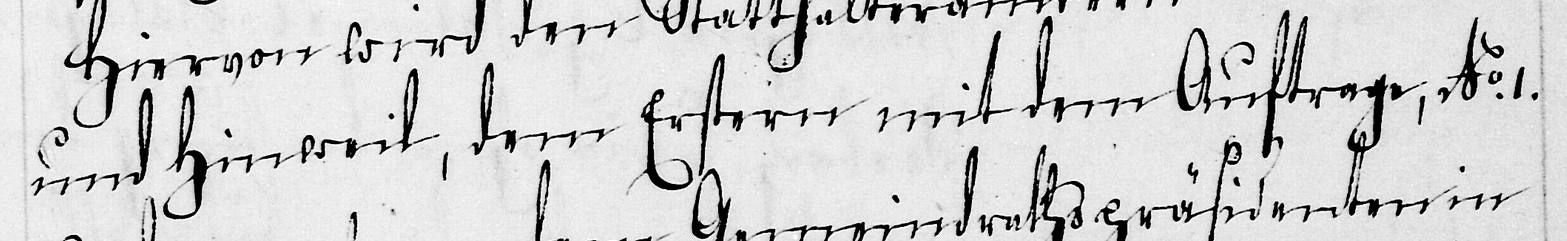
und Hinweil, dem Erstern mit dem Auftrage, No.
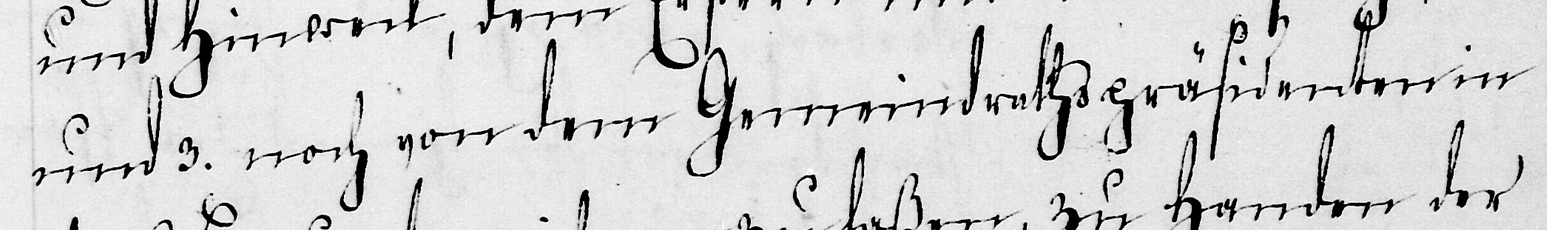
und 3. noch von dem Gemeindrathspräsidenten in
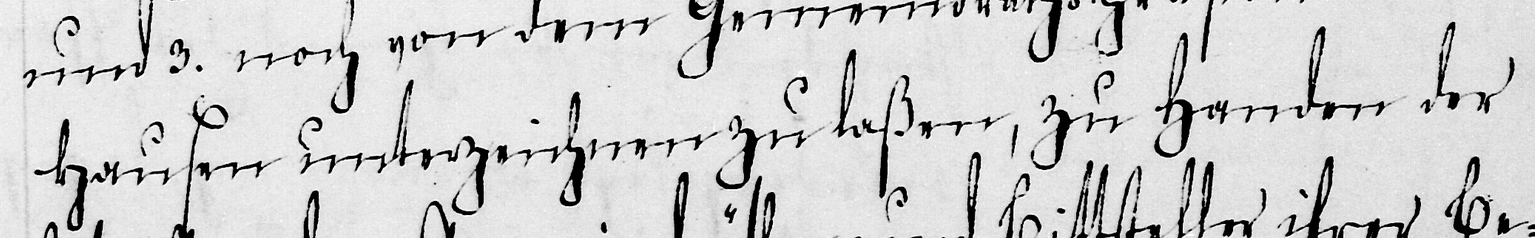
Hausen unterzeichnen zu laßen, zu Handen der
